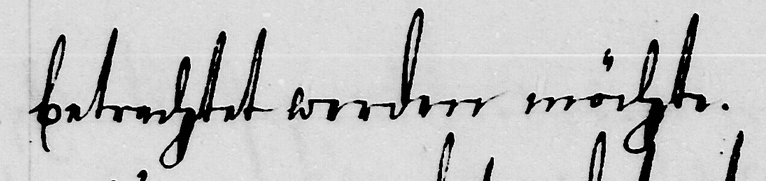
betrachtet werden möchte.
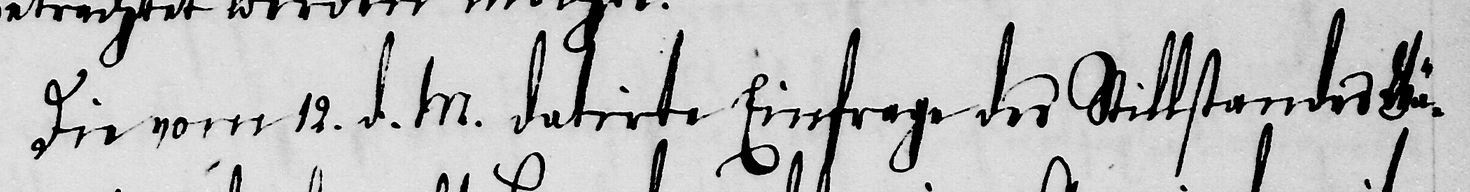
Die vom 12. d. M. datirte Einfrage des Stillstandes Wä¬
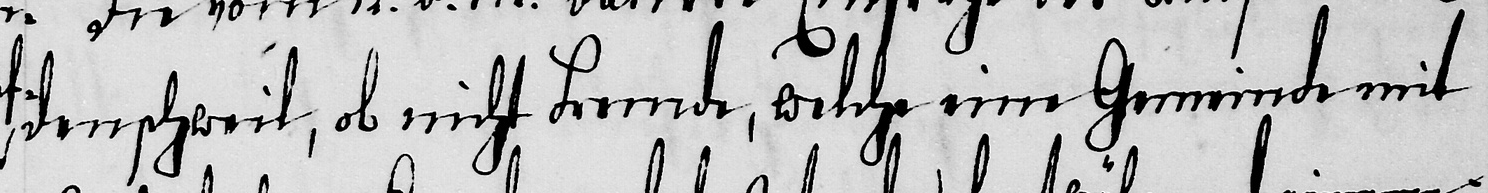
denschweil, ob nicht Fremde, welche eine Gemeinde mit
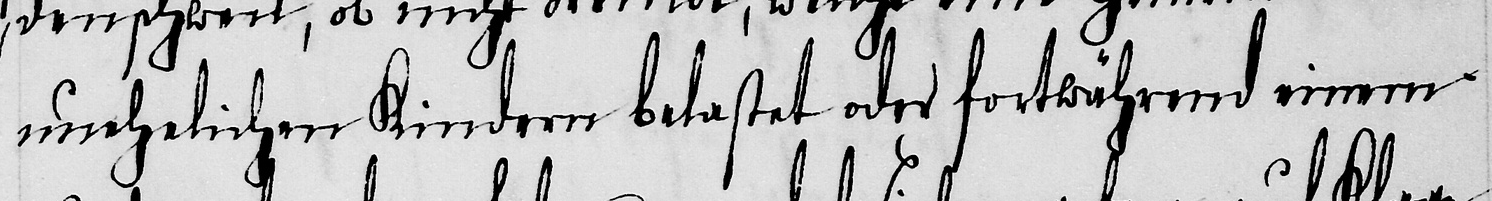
unehelichen Kindern belastet oder fortwährend einem
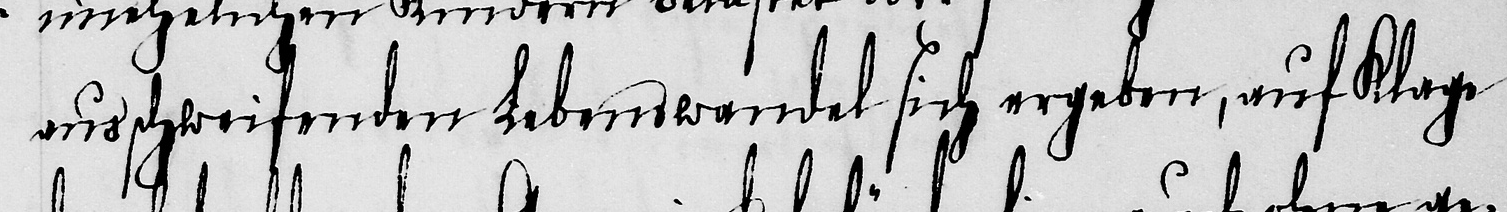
ausschweifenden Lebenswandel sich ergeben, auf Klage
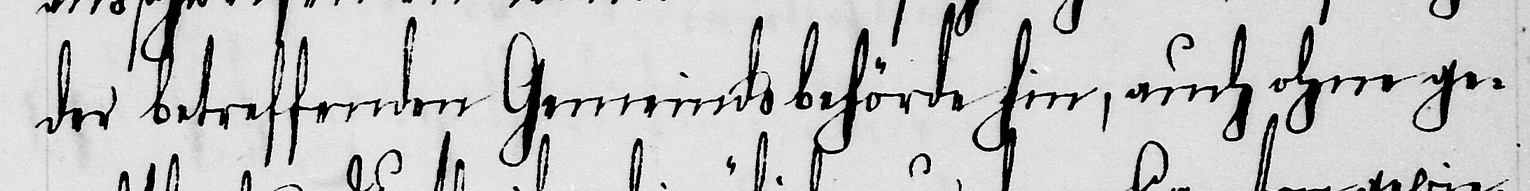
der betreffenden Gemeindsbehörde hin, auch ohne ge¬
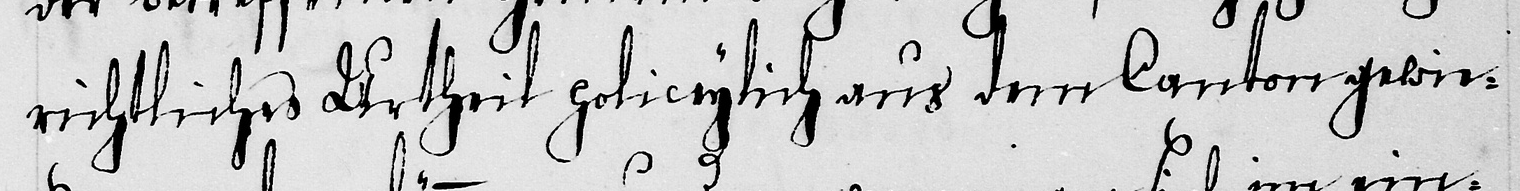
richtliches Urtheil policeylich aus dem Canton gewie¬
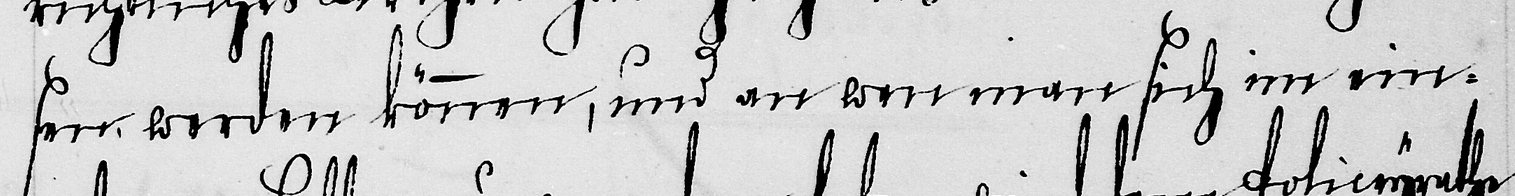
sen werden können, und an wen man sich in ein¬
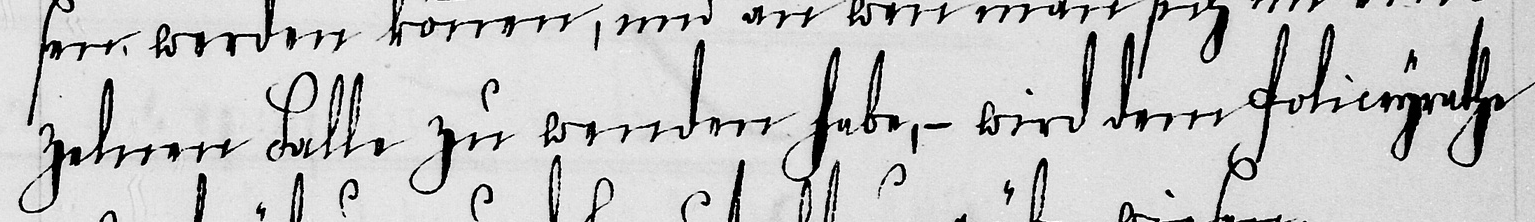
zelnen Falle zu wenden habe, – wird dem Policeyrathe
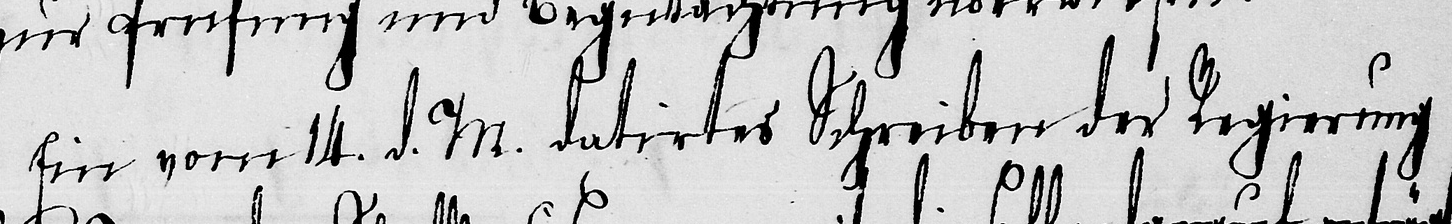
Ein vom 14. d. M. datirtes Schreiben der Regierung
